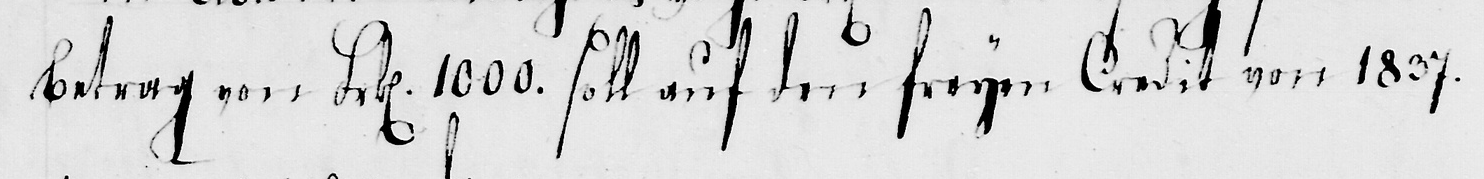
Betrag von Frk[en]. 1000. soll auf den freyen Credit von 1837.
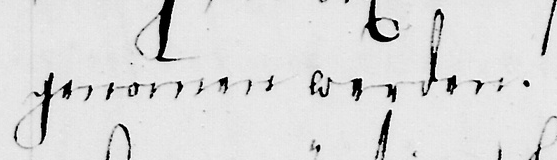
genommen werden.
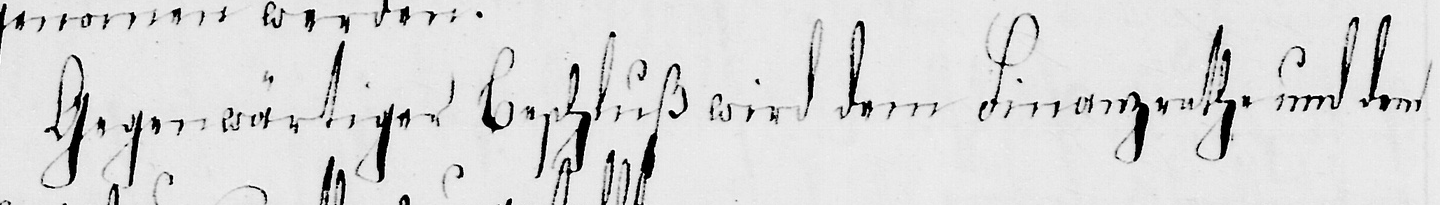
Gegenwärtiger Beschluß wird dem Finanzrathe und dem
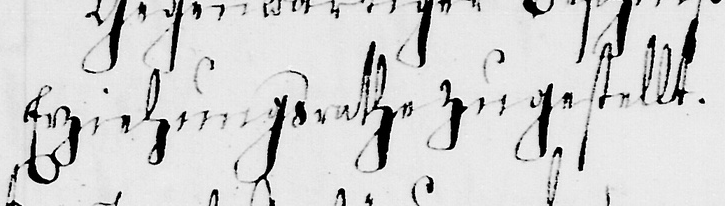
Erziehungsrathe zugestellt.
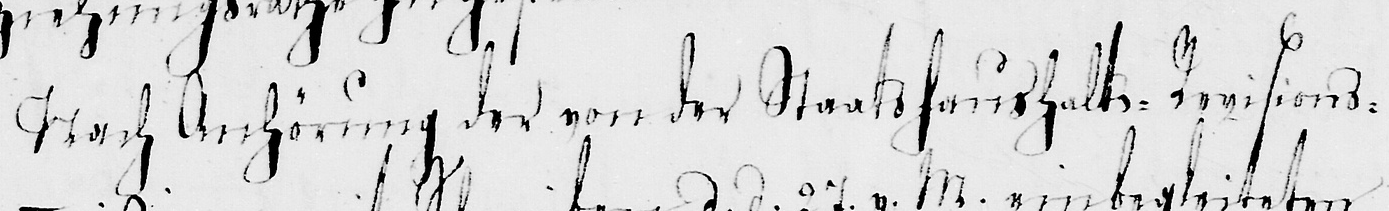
Nach Anhörung der von der Staatshaushalts-Revision¬
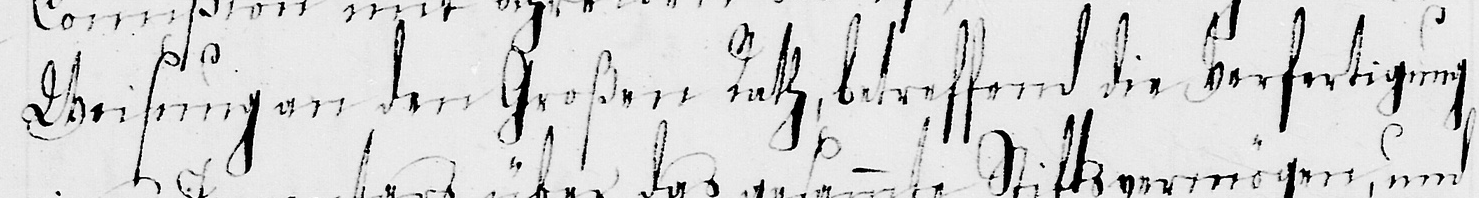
Weisung an den Großen Rath, betreffend die Verfertigung
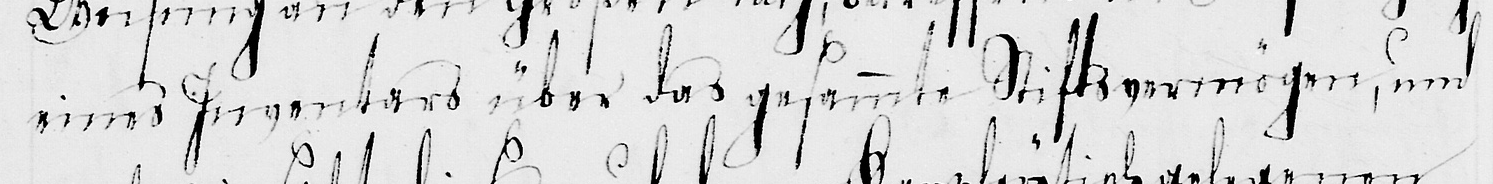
eines Inventars über das gesammte Stiftsvermögen, und
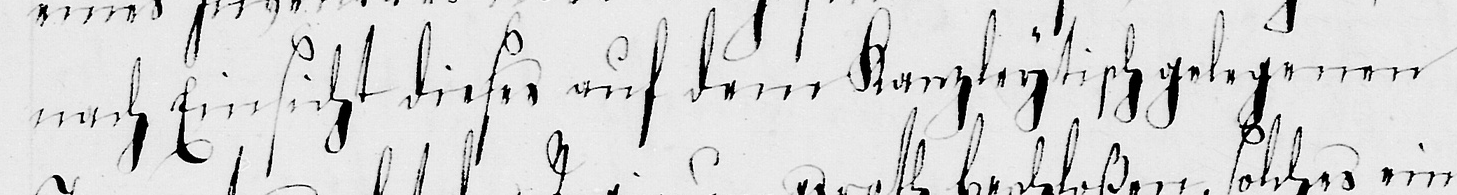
nach Einsicht dieses auf dem Kanzleytisch gelegenen
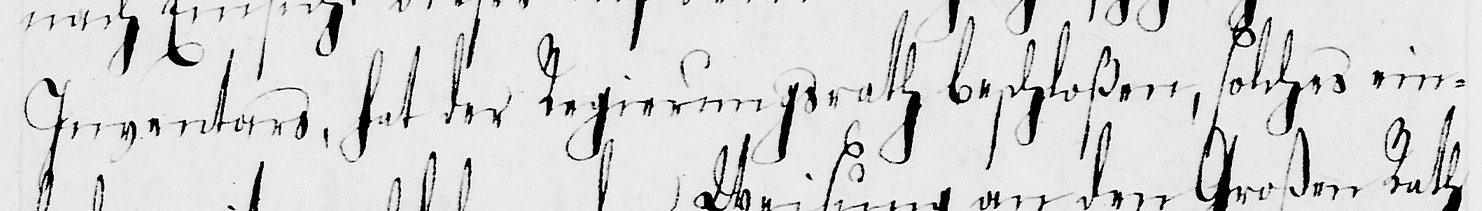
Inventars, hat der Regierungsrath beschloßen, solches ein¬
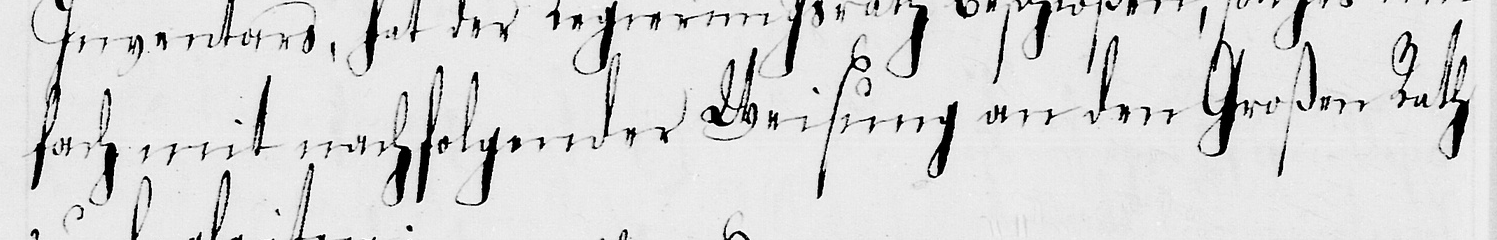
fach mit nachfolgender Weisung an den Großen Rath
